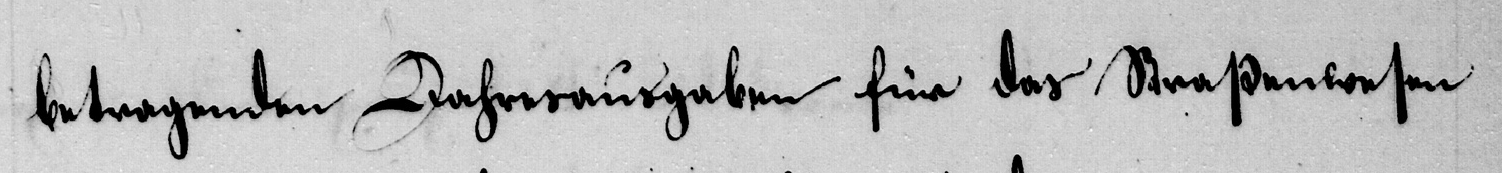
betragenden Jahresausgaben für das Straßenwesen
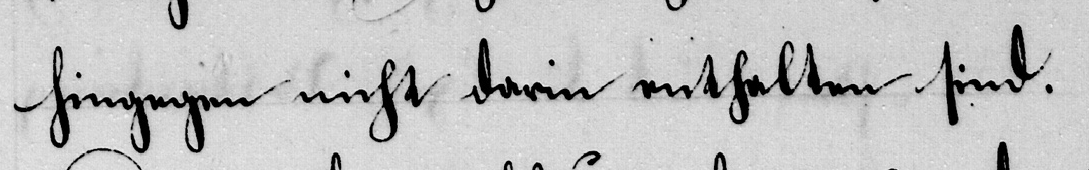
hingegen nicht darin enthalten sind.
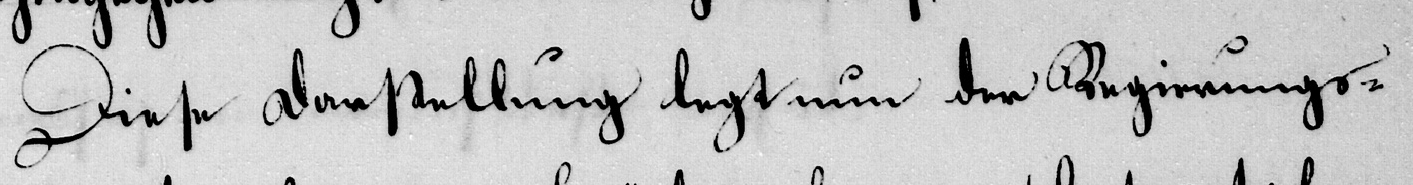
Diese Darstellung legt nun der Regierungs¬
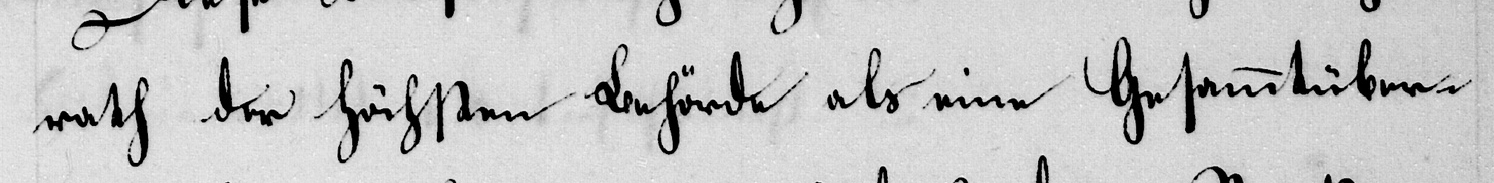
rath der höchsten Behörde als eine Gesammtüber¬
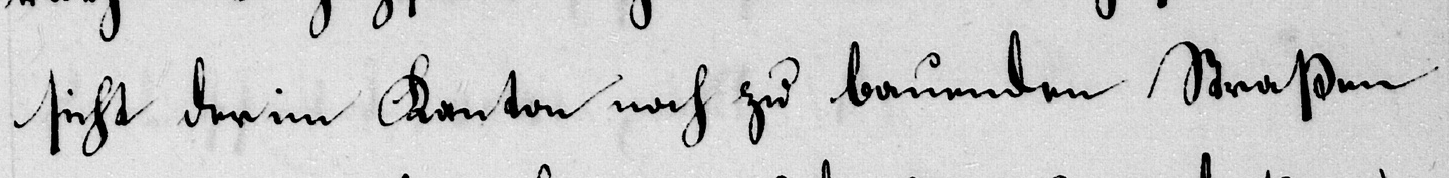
sicht der im Kanton noch zu bauenden Straßen
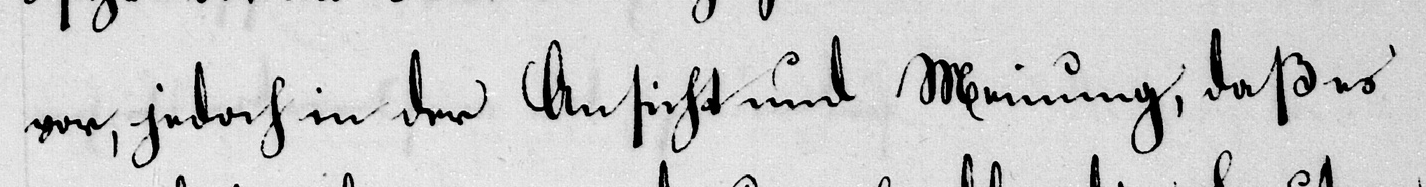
vor, jedoch in der Ansicht und Meinung, daß es
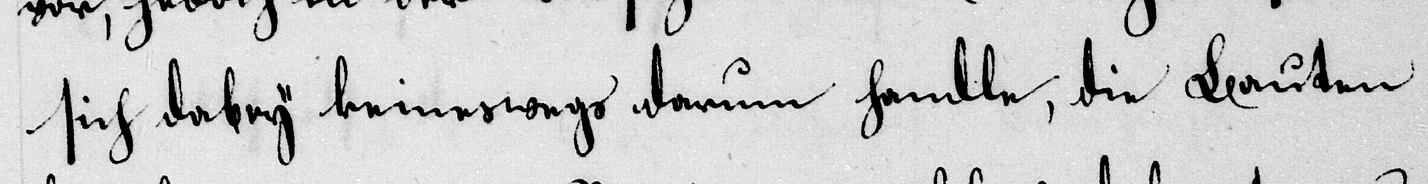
sich dabey keineswegs darum handle, die Bauten
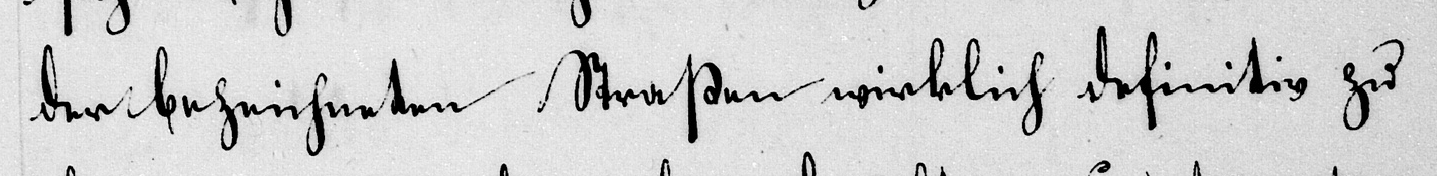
der bezeichneten Straßen wirklich definitiv zu
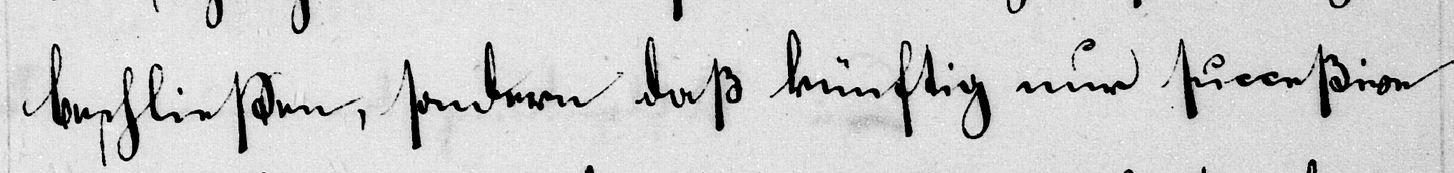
beschließen, sondern daß künftig nur succeßive
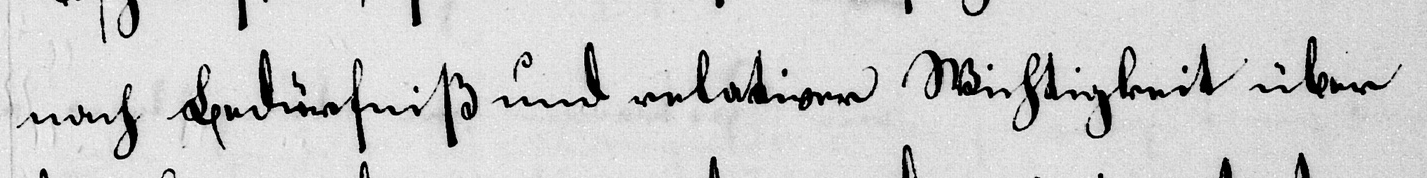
nach Bedürfniß und relativer Wichtigkeit über
